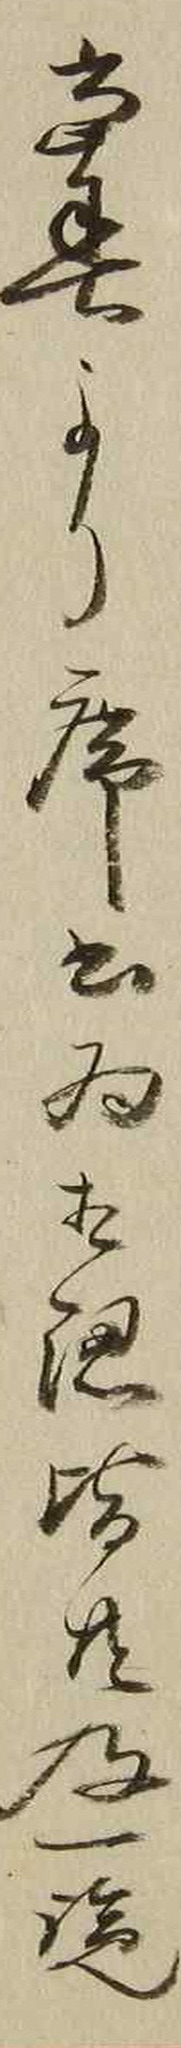当春より席出為相認皆共及一覧
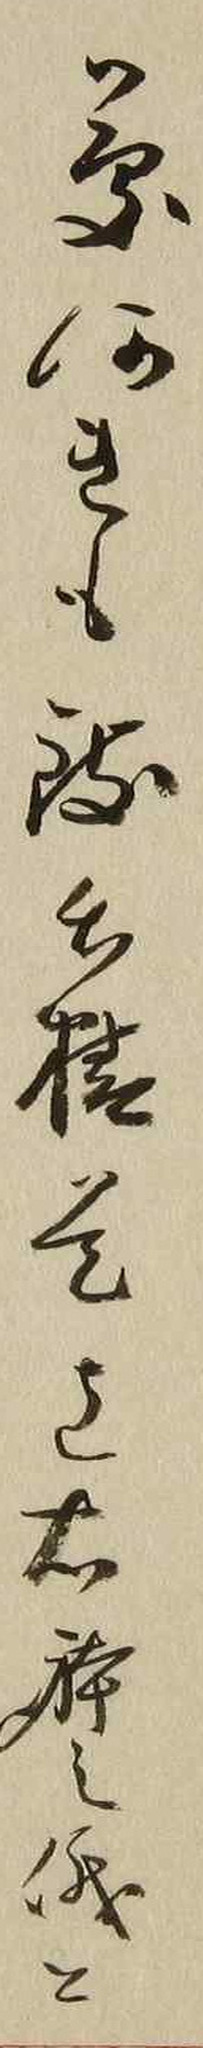候処何れも致出精是迄右体之儀と
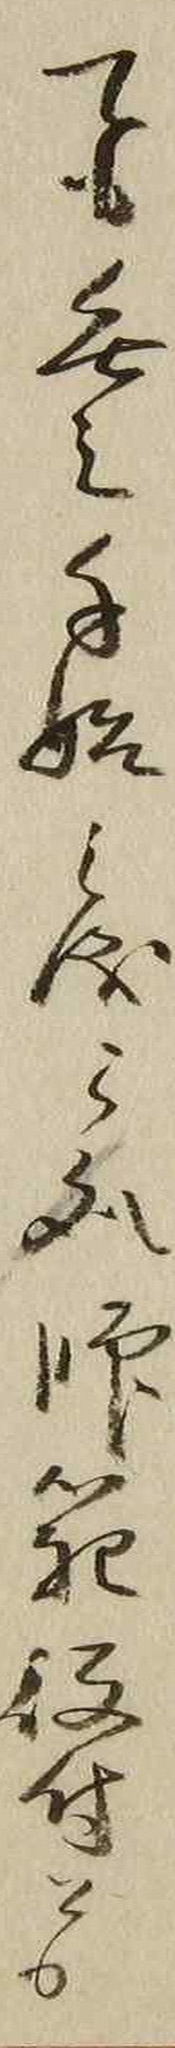ても無之手始之儀之処師範役付との
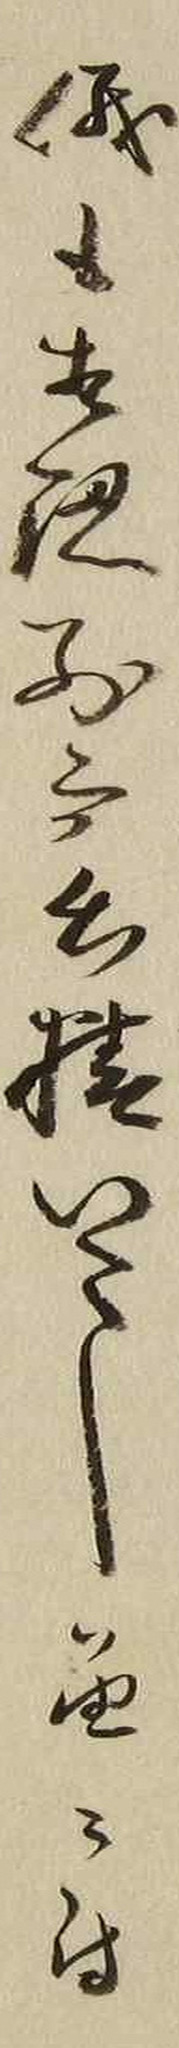儀も相認別而出精いたし候由ニ付
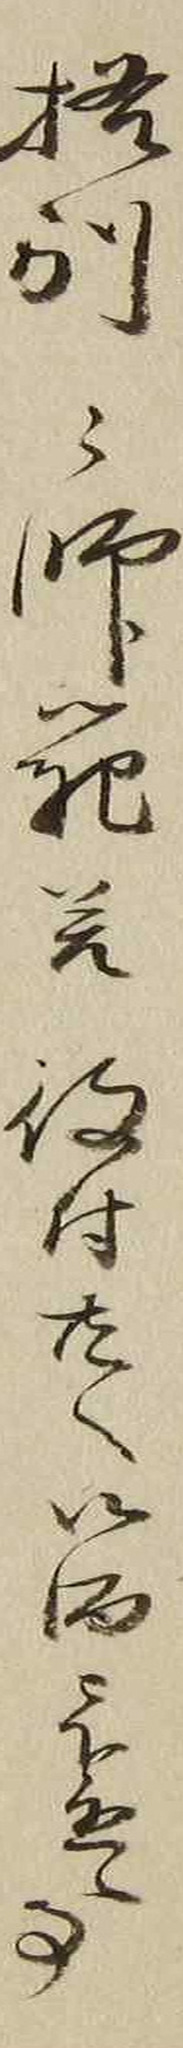格別ニ師範并役付共へ御酒被下置候事
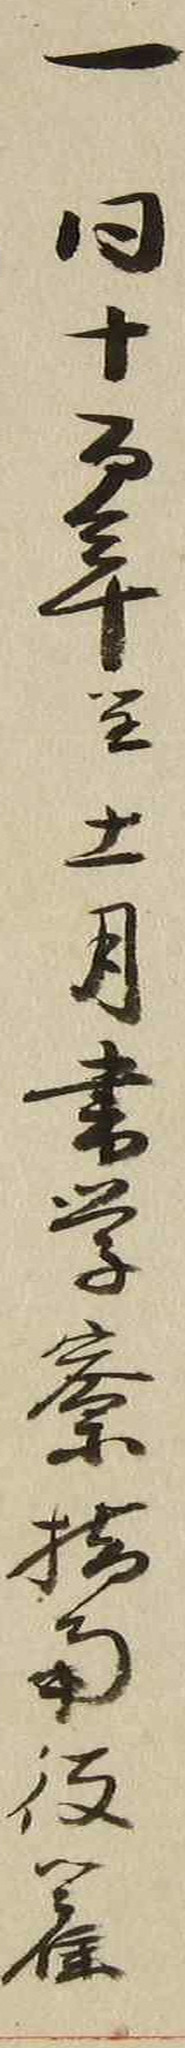一同十酉年閏十一月書学寮指南役御雇
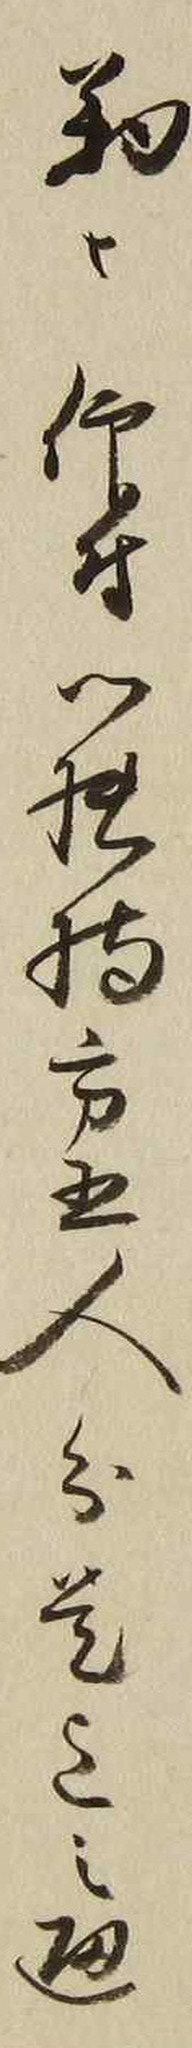勤被仰付扶持方五人分是迄之通
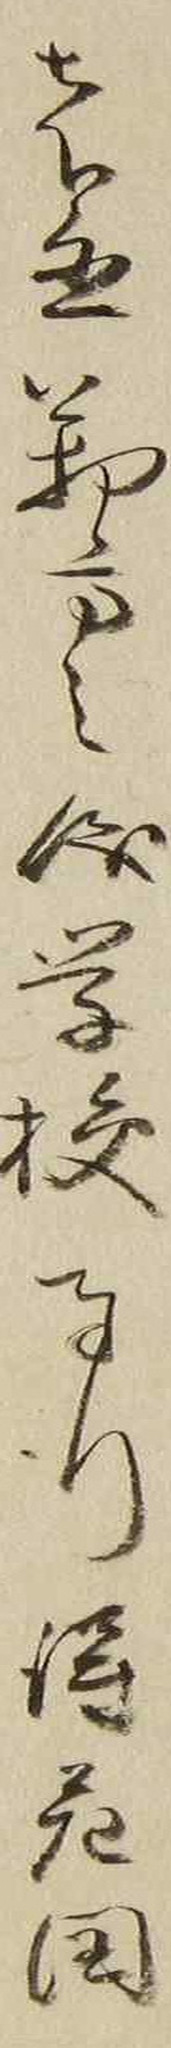被下置勤方之儀学校奉行得差図
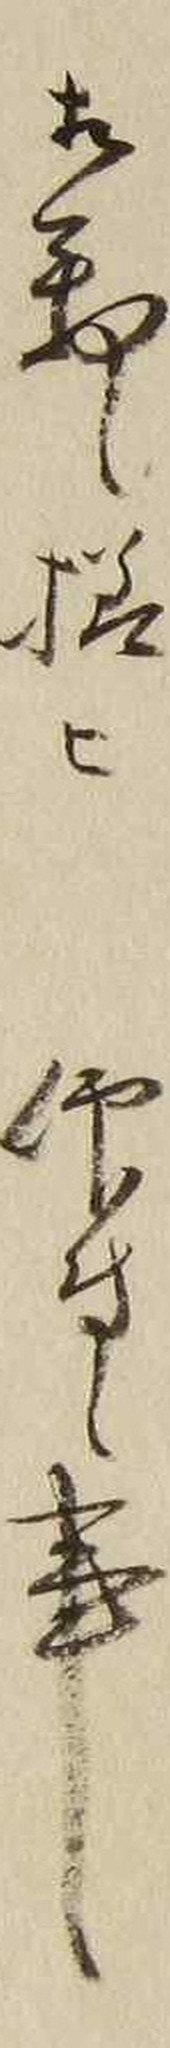相勤候様被仰付候事
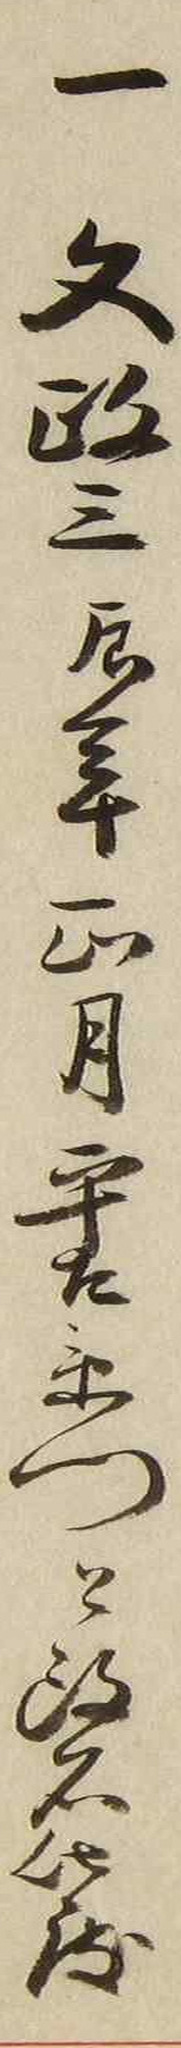一文政三辰年正月平左衛門と改名仕度
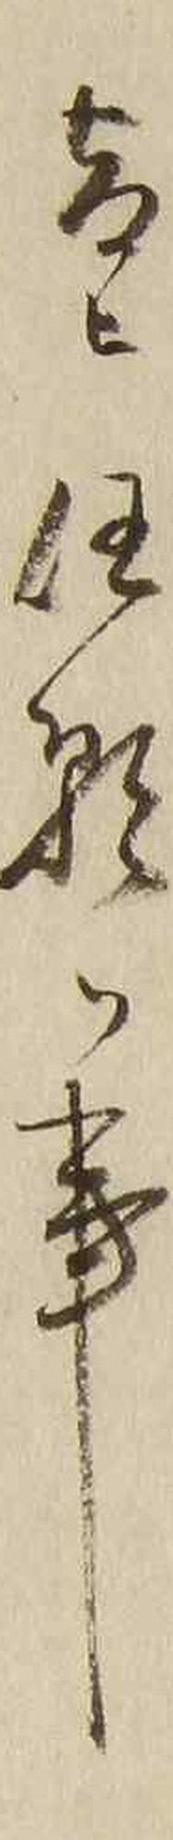旨被任願候事

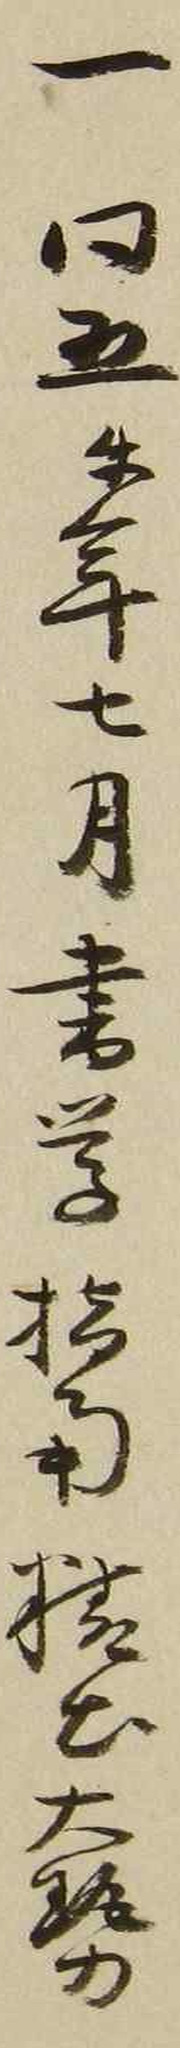一同五午年七月書学指南精出大勢
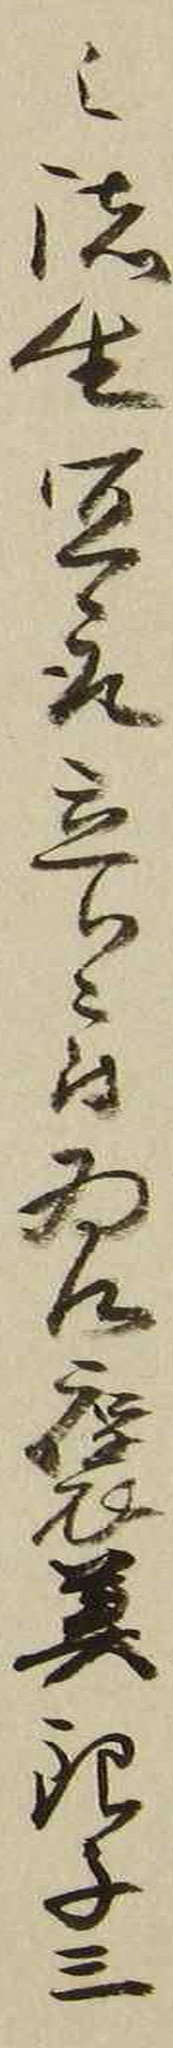之諸生宜取立候ニ付為御褒美銀子三
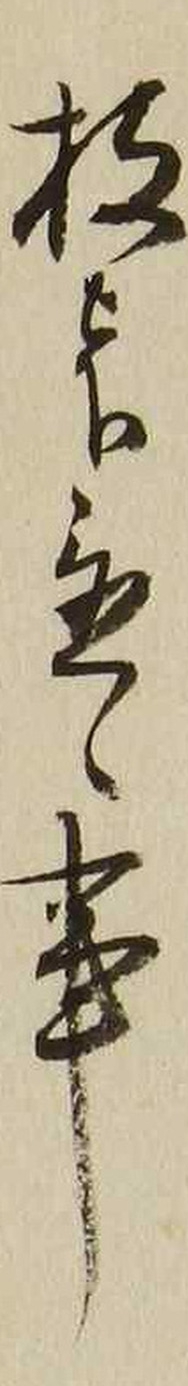枚被下置候事
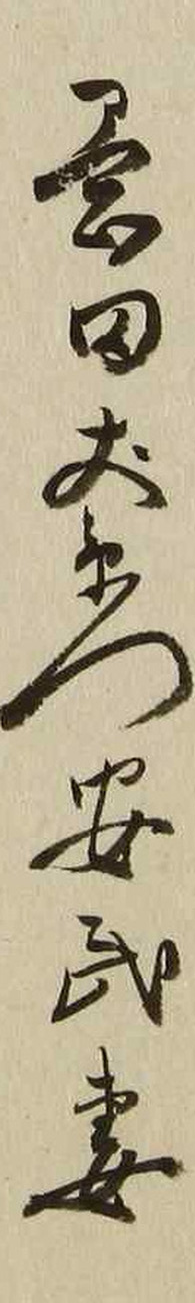岡田丈衛門安武妻
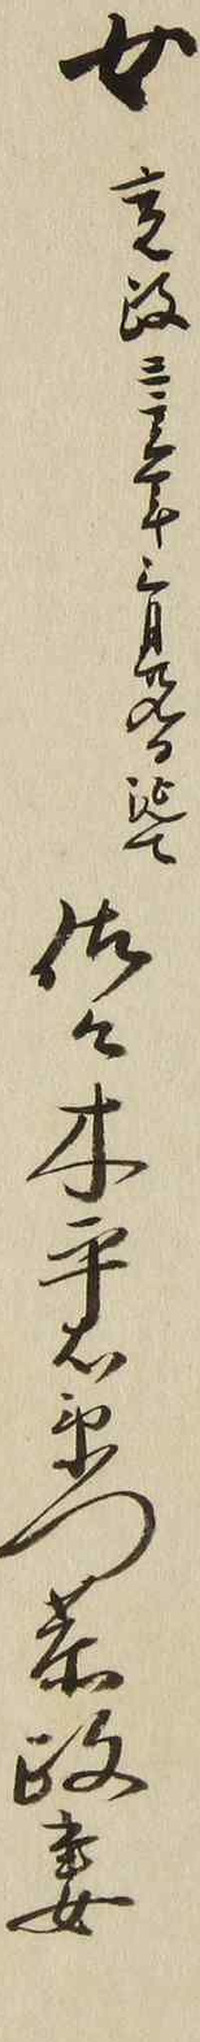女寛政三亥年三月廿九日誕生佐々木平右衛門泰政妻
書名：諸士系譜　巻之288　さ之部20
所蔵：会津若松市立会津図書館
